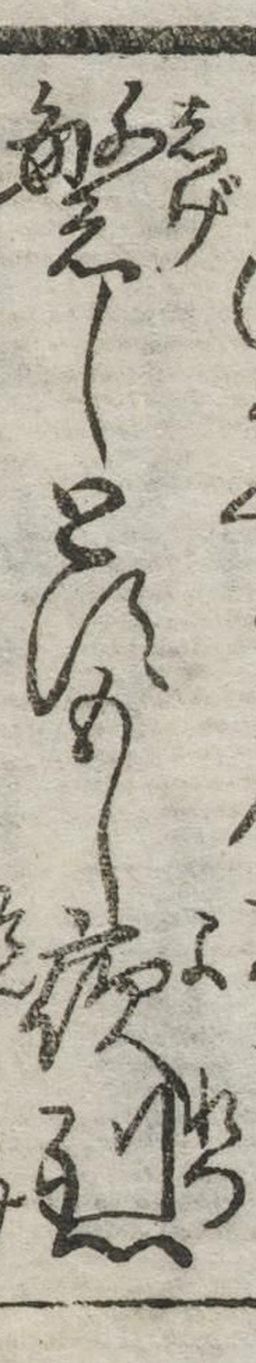繁しとすもし夜烈
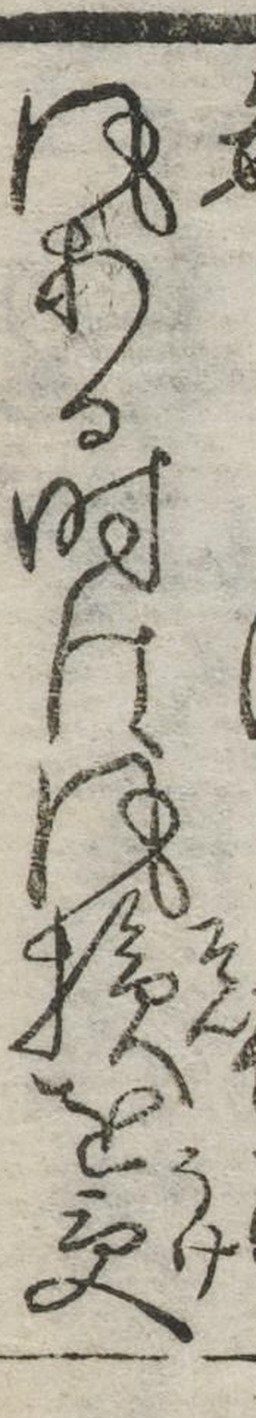風ある時は風損を受

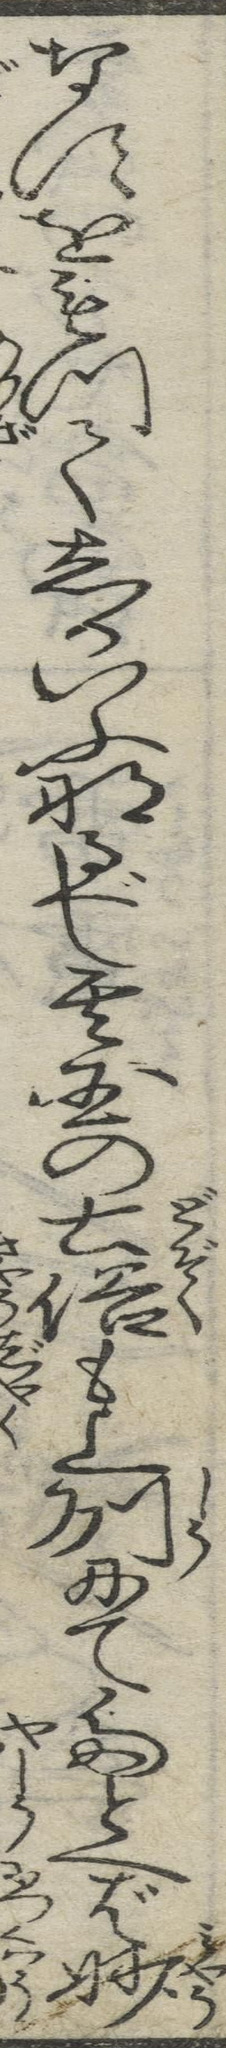なすをもつてしかいふなるべし其国の土俗も上州にてたとへば妙
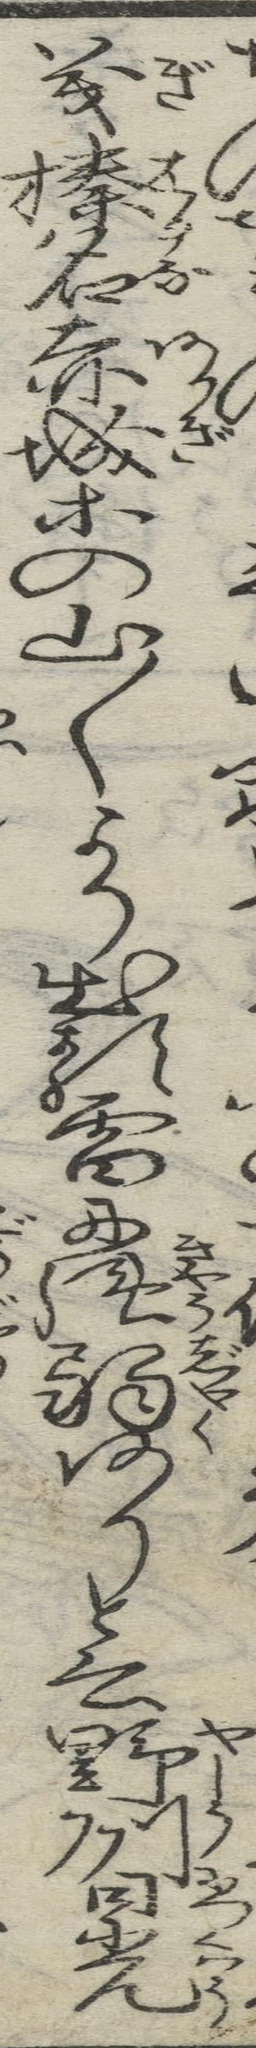義榛名赤城等の山〳〵より出る雷に強弱ありと云野州日光
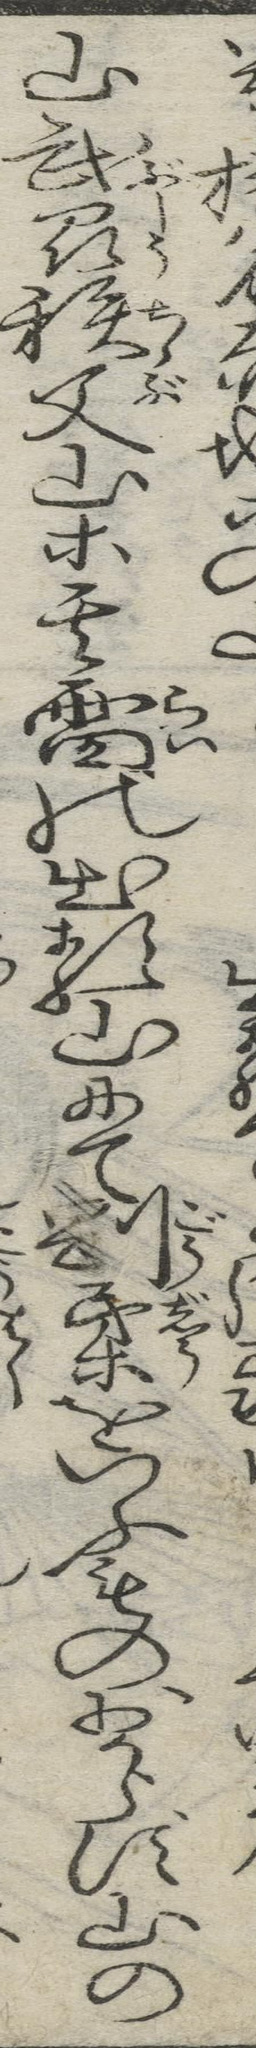山武州秩父山等其雷の出る山にて剛柔をいふもの少からす山の
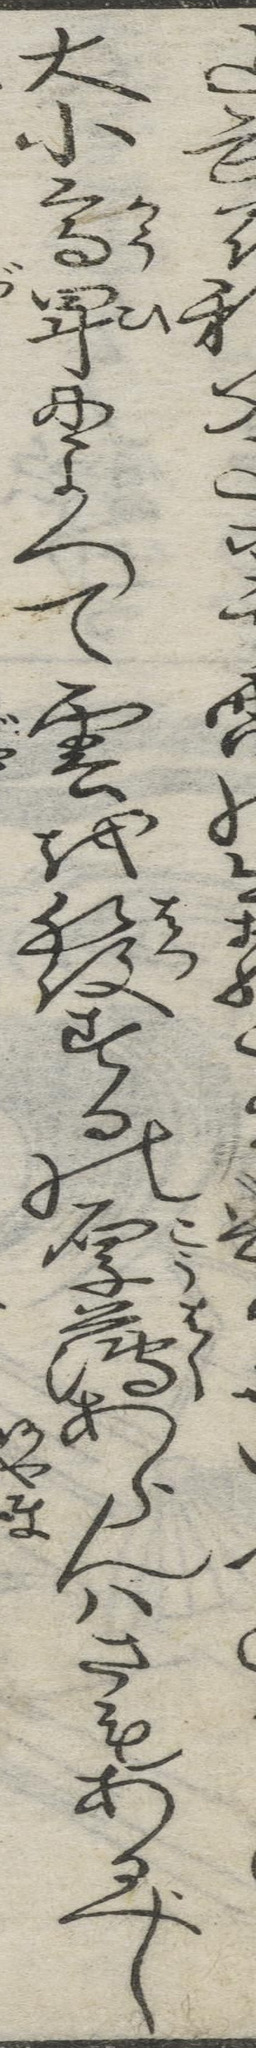大小高卑によつて雲を発するの厚薄あらんはさもあるべし
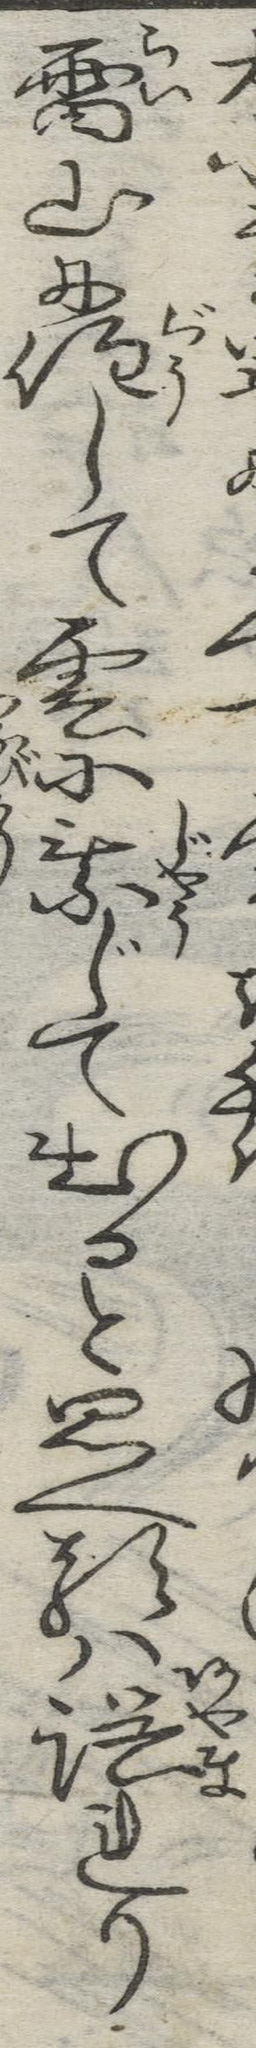雷山に住して雲に乗じて出ると思へるは誤れり
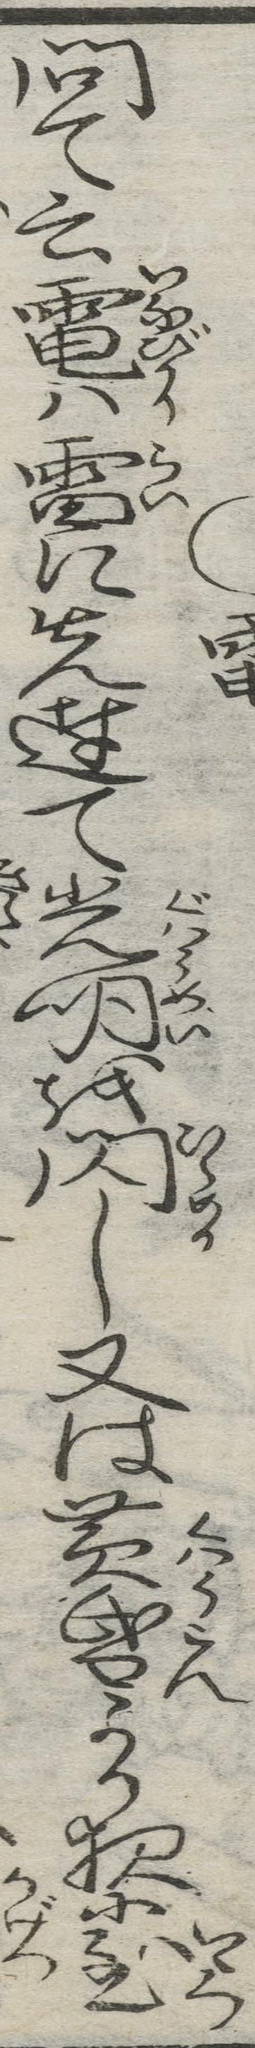問て云電は雷に先達て光明を閃し又は黄昏から夜に至
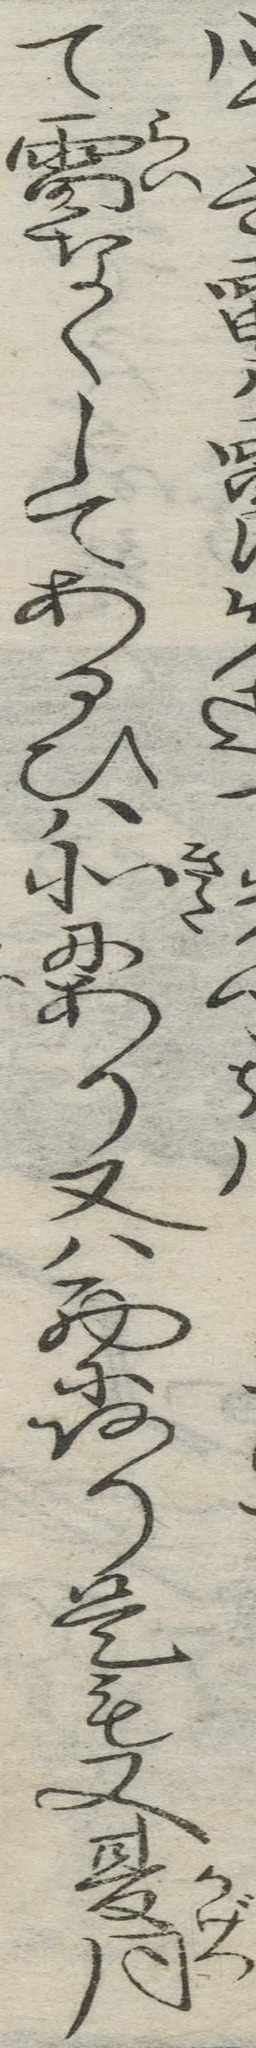て雷なくしてあるひは北にあり又は南にあり是も又夏月
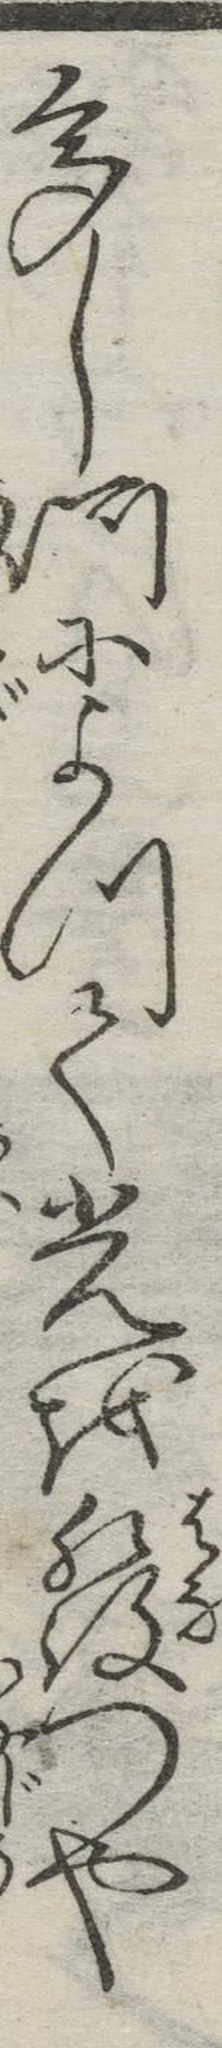多し何によつて光を発つや
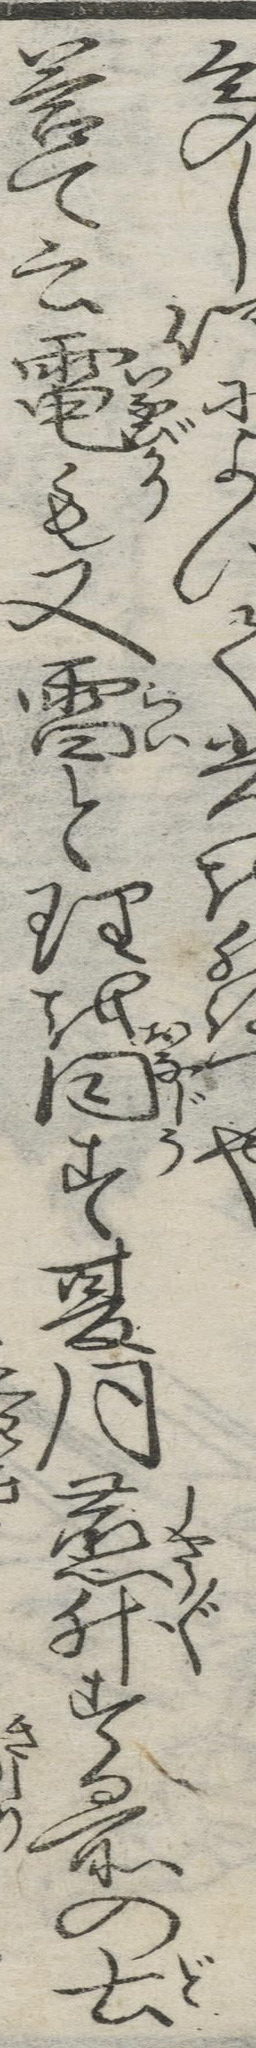答て云電も又雷と理を同す夏月蒸升する所の土
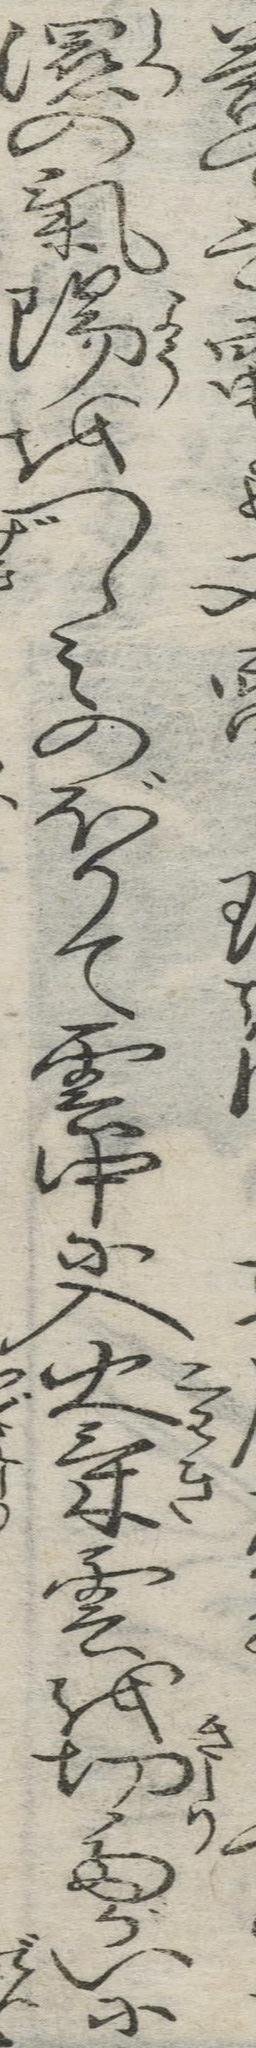湿の気陽をつきのぼりて雲中に入火気雲を切たかいに
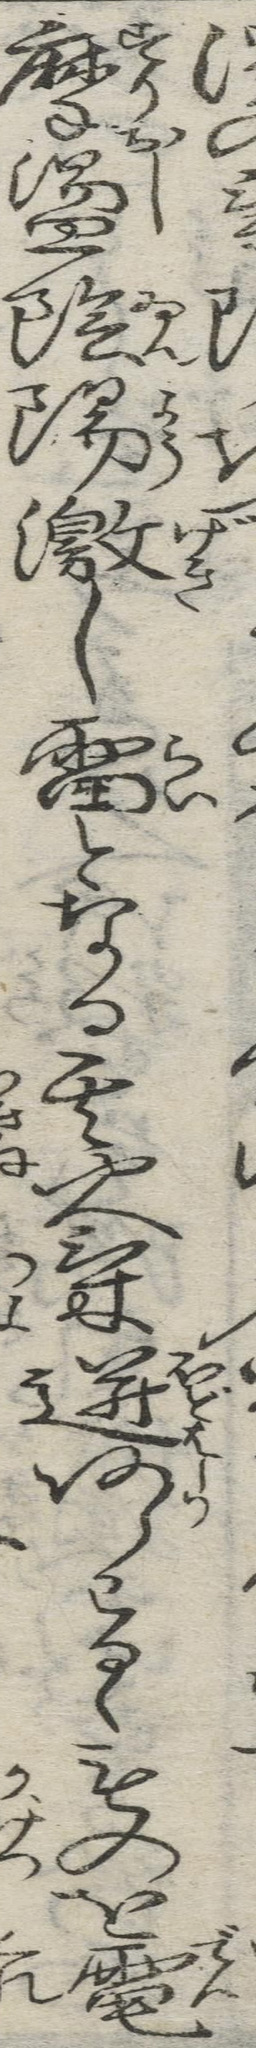磨盪陰陽激し雷となる其火気迸あわるゝものを電
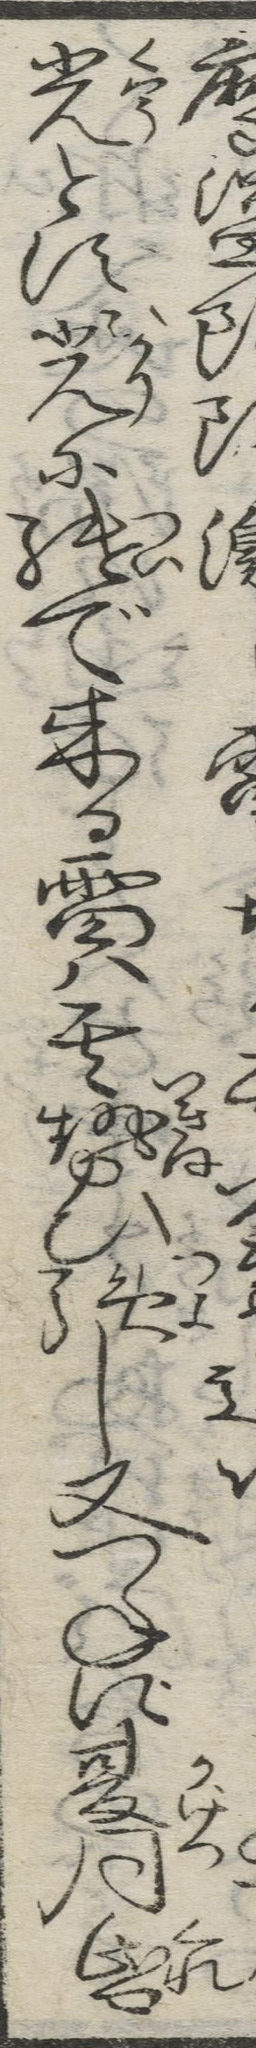光とす光に継で来る雷は其勢ひ強し又つねに夏月昏
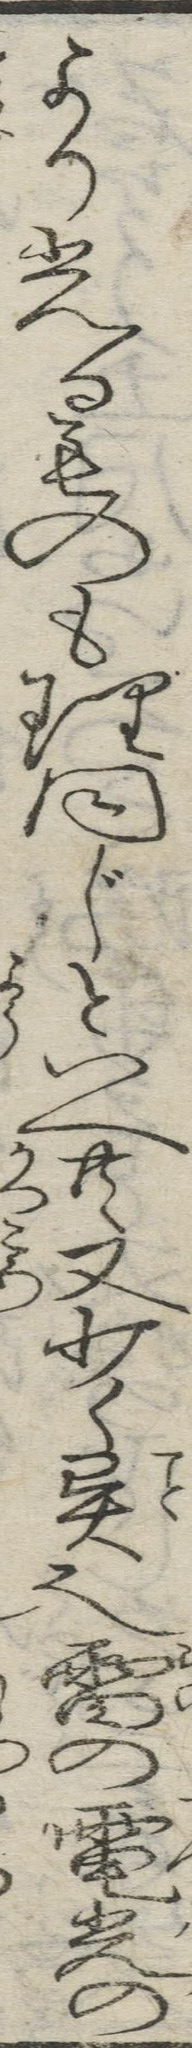より光るものも理同じといへと又少し異也雷の電光の
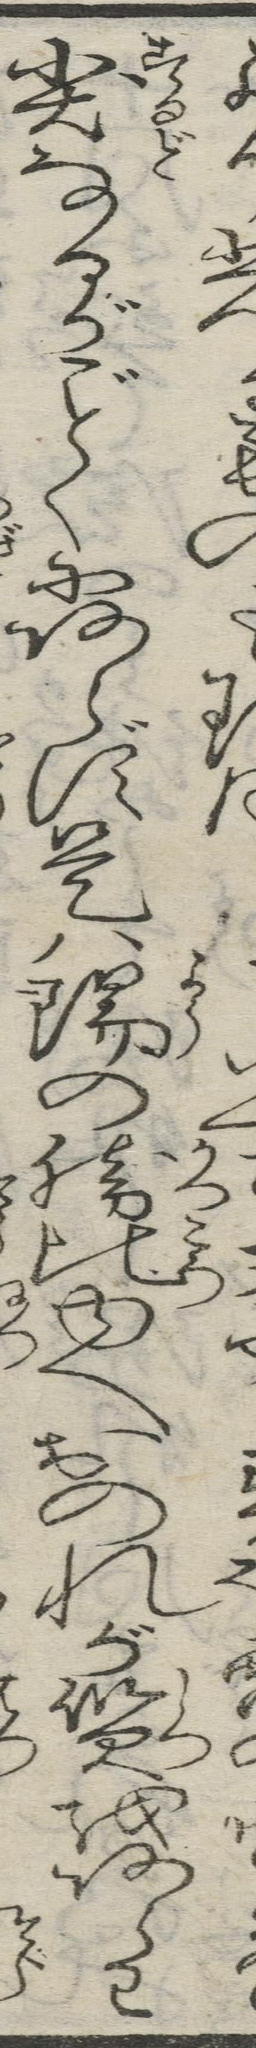尖なるがごとくにあらず是は陽の勝比ゆへおのれが質をあらわ
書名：訓蒙天地辨　地
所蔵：東京大学地震研究所図書室 Earthquake Research Institute Library, The University of Tokyo, JAPAN
